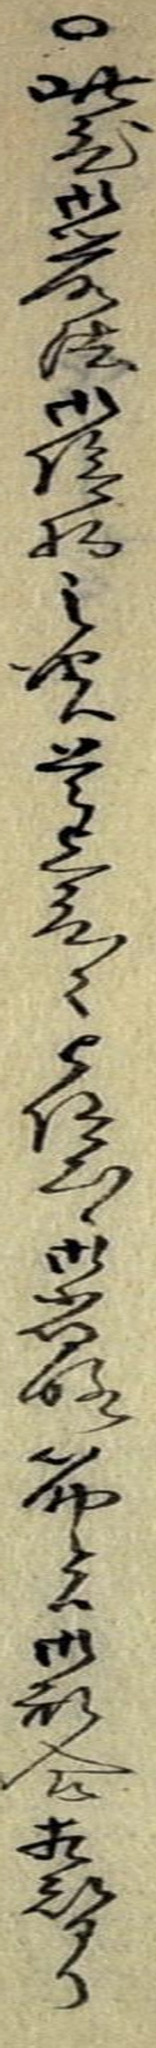〇此度御厳法御倹約之儀ハ是迄度々被仰出候御省略筋とハ御形合相替り
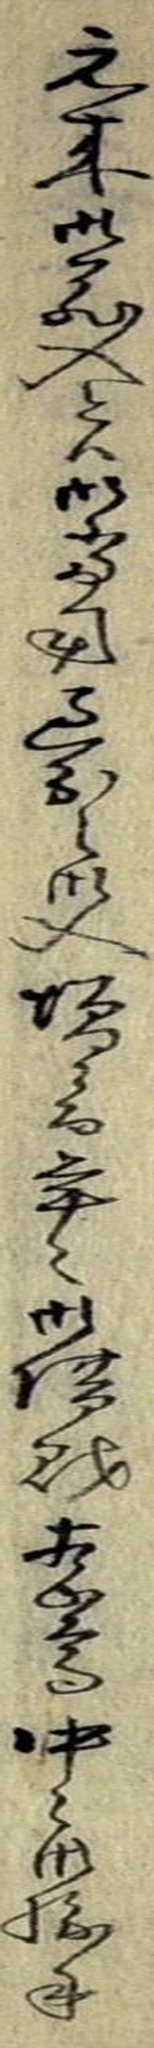元来御蔵入とハ御当用過分之御入増ニ而年々御借財相嵩中々御勝手
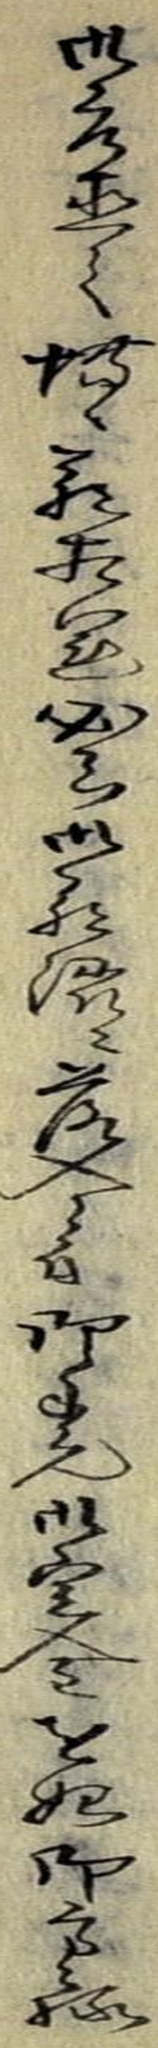御取直之場へ難相運必至御難渋ニ落入候ニ付御手元御定金を始御方々様
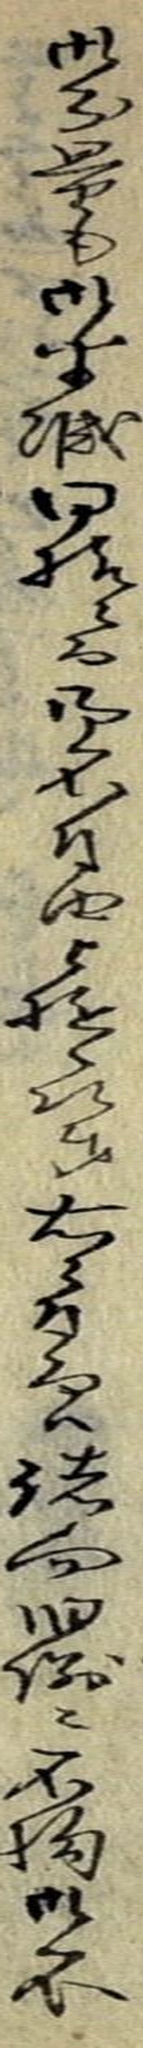御分量も御半減同様ニ而御不自由被遊候次第右ニ付而ハ諸向旧例ニ不拘御不
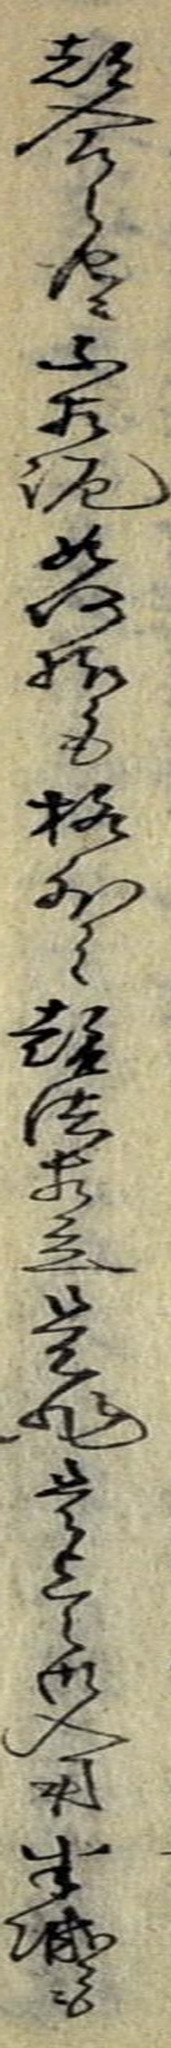都合之儀ニ不相泥如何様ニも格別之趣法相立是非是迄之御入用半減ニも
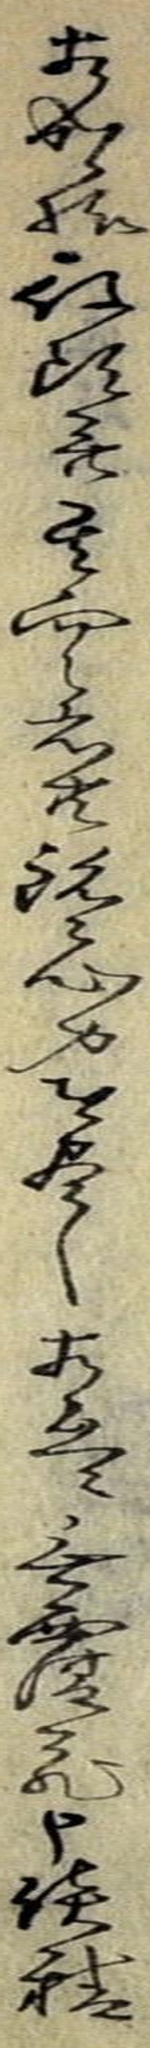相成候様役頭并其向之者共銘々心力を尽し相互ニ無覆蔵申談精
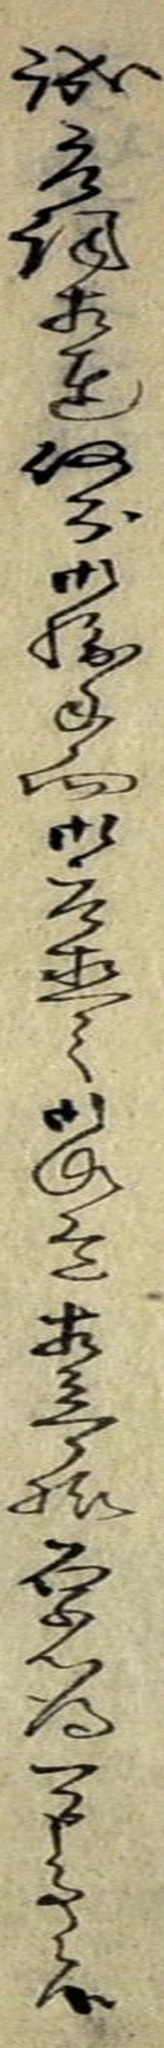誠取調相達何分御勝手向御取直之御趣意相立候様厚心得可申事ニ候
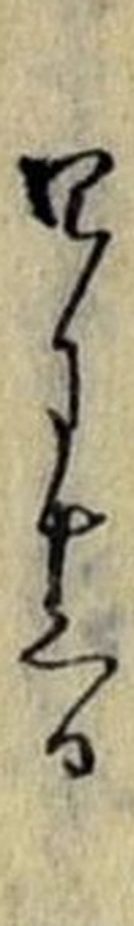四月十二日
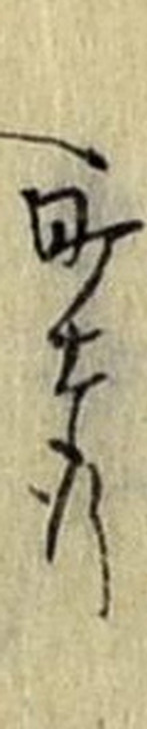町奉行
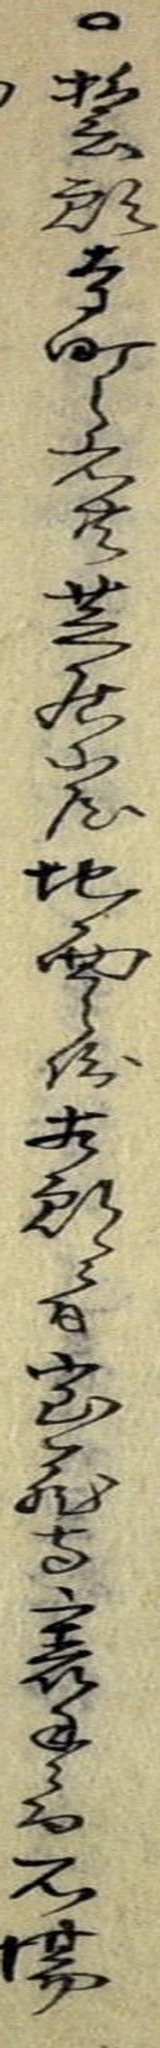〇誓願寺町之者共芝居小屋地面之儀相願候ニ付宝蔵寺裏手ニ而石場
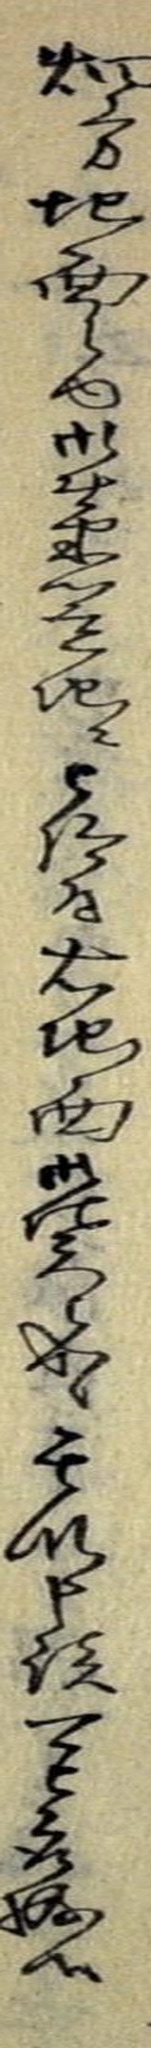畑方地面之内御薬薗地ニ被仰付右地面御貸被成候其段申談可被取扱候
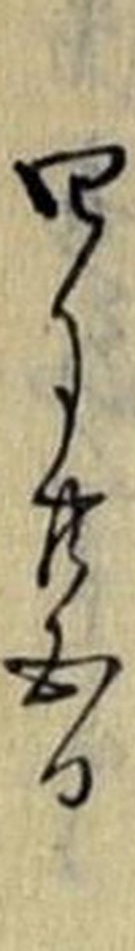四月廿五日
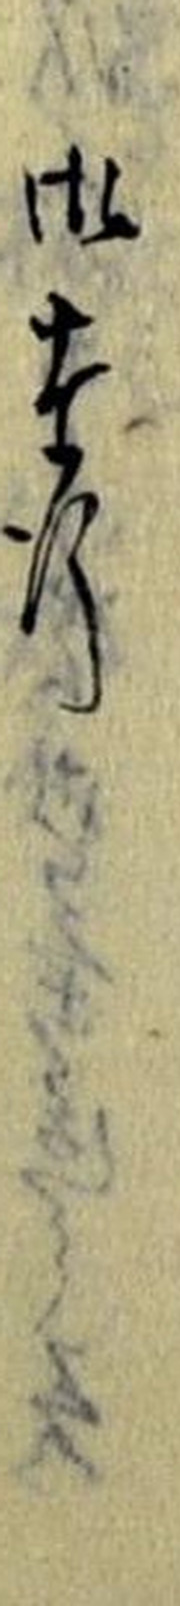御奉行
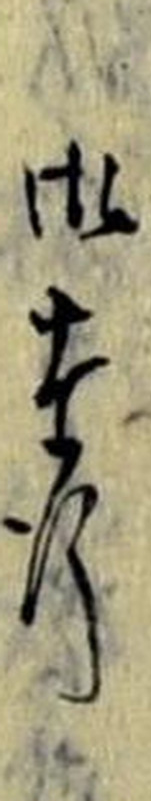御奉行
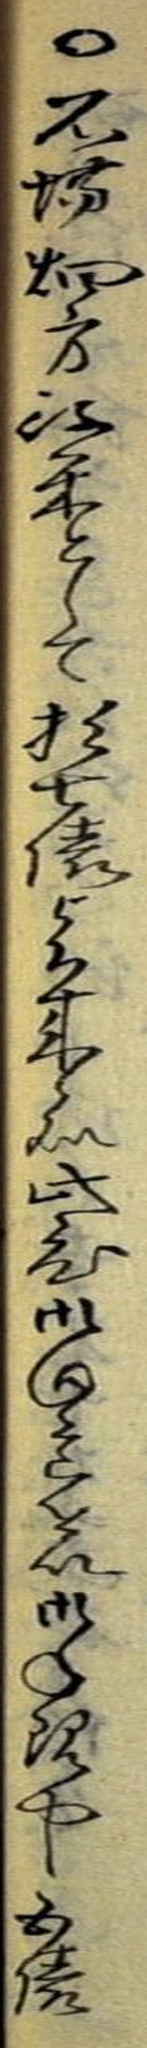〇石場畑方役米として拾七俵被下来候処此度御趣意を以御年限中五俵
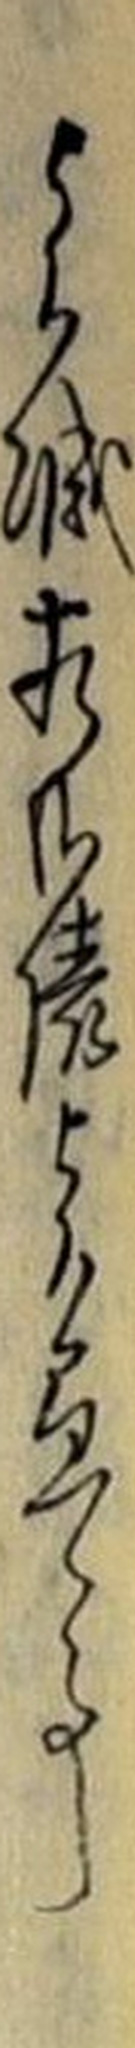被下減拾弐俵被下置候事
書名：命令之部 五
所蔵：福井県文書館 Fukui Prefectural Archives
